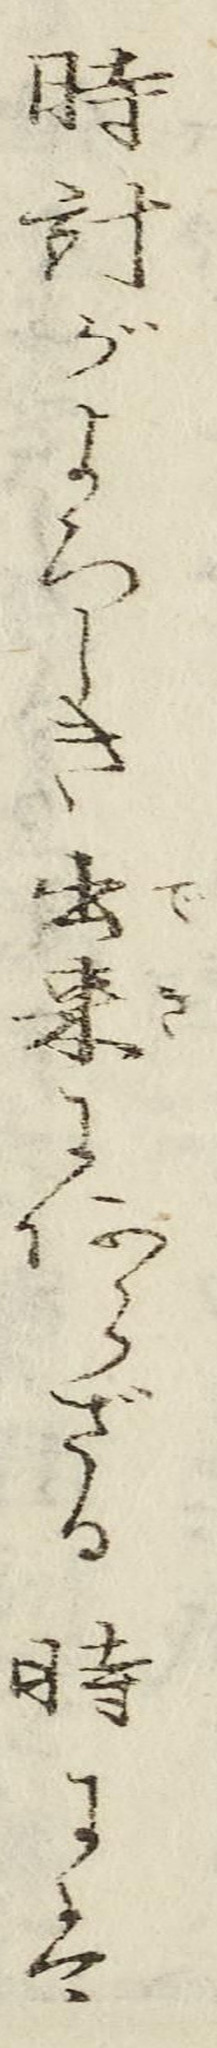時計がよろしき出来にあらざる時には
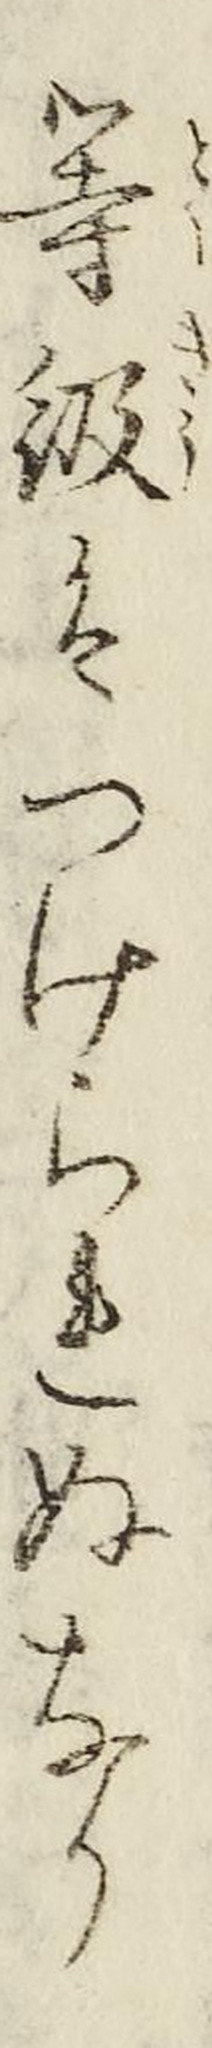等級はつけられぬなり
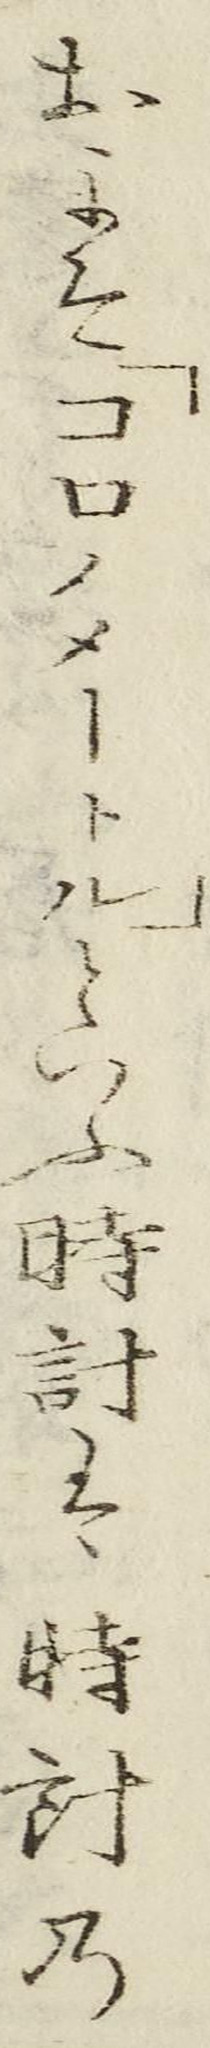およそ「コロノメートル」といふ時計は時計の
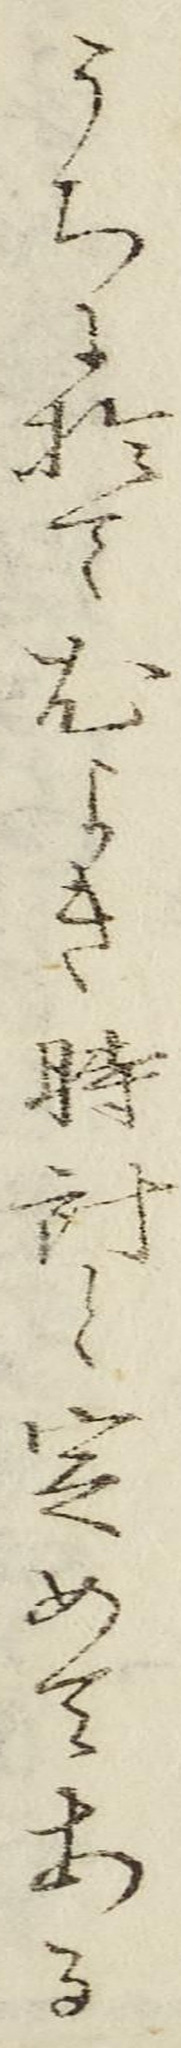うちに於て尤よき時計と定めてある
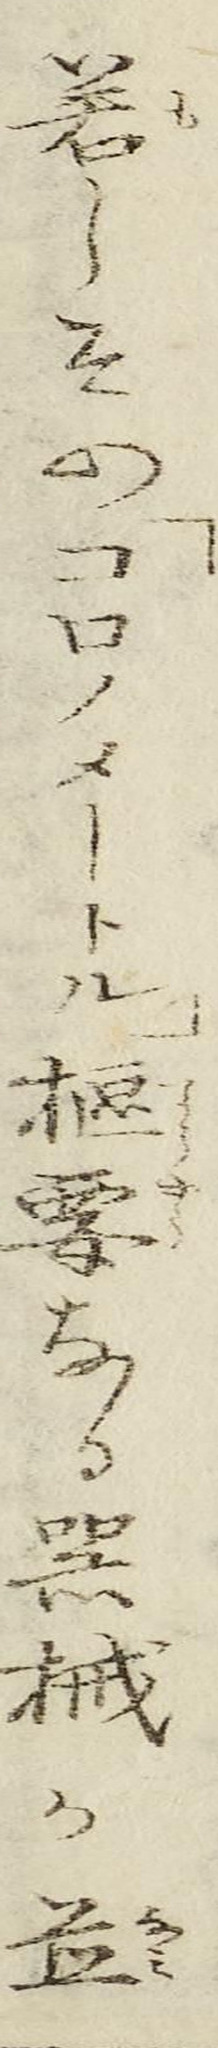若しその「コロノメートル」枢要なる器械か並

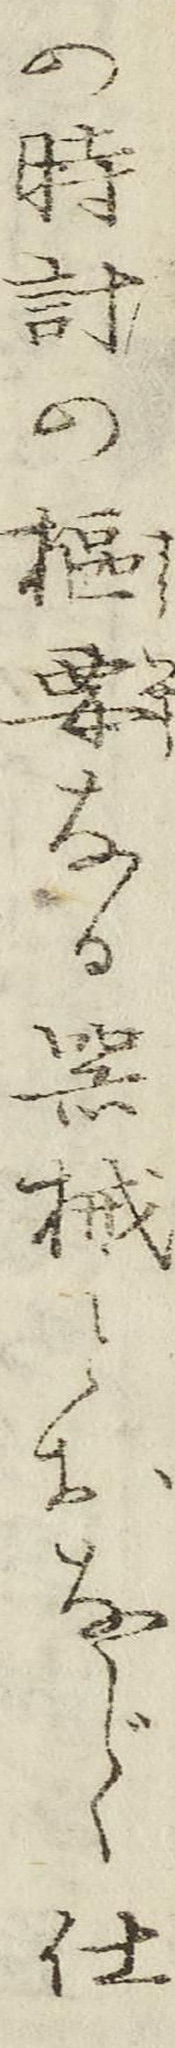の時計の枢要なる器械とおなじく仕
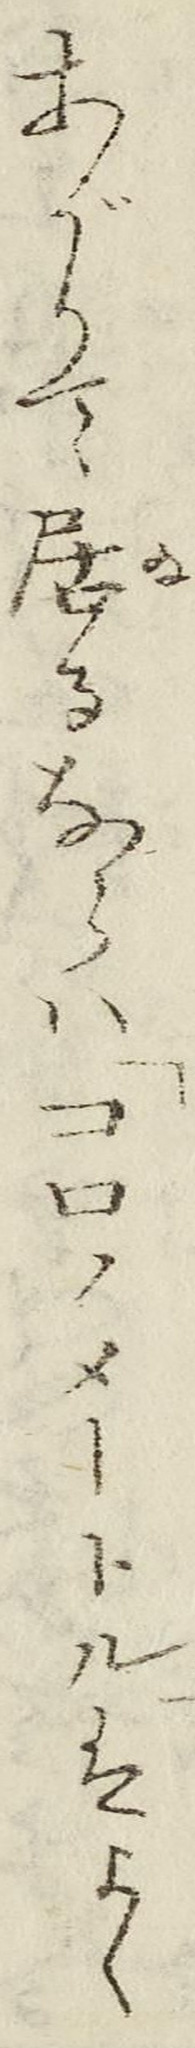あがりて居るならは「コロノメートル」はよく
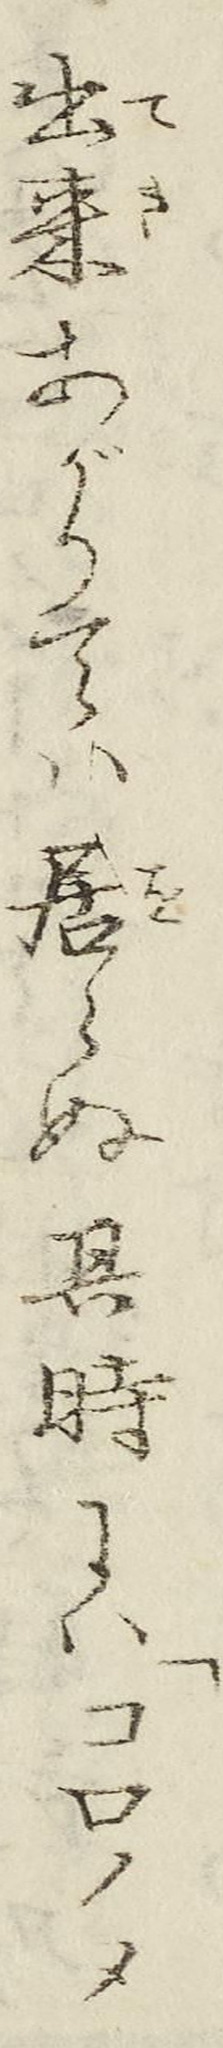出来あがりては居らぬ其時には「「コロノメ
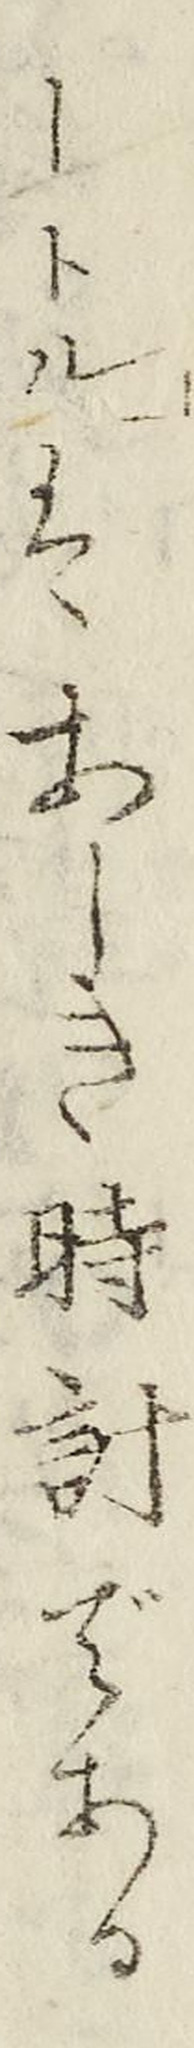ートル」はあしき時計である
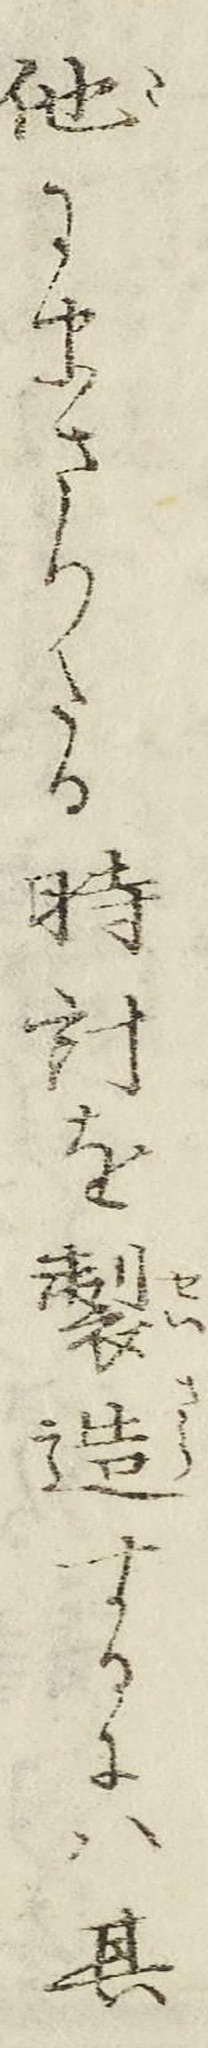他にまさりたる時計を製造するには其
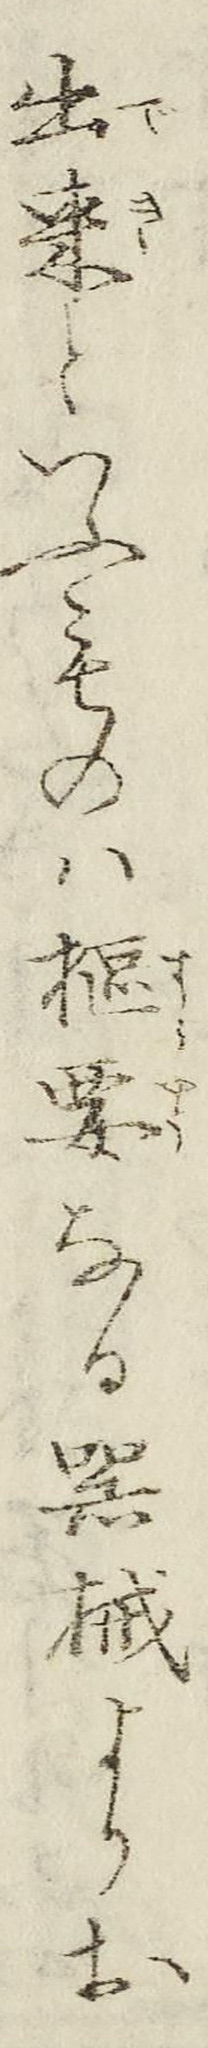出来といふものは枢要なる器械よりお
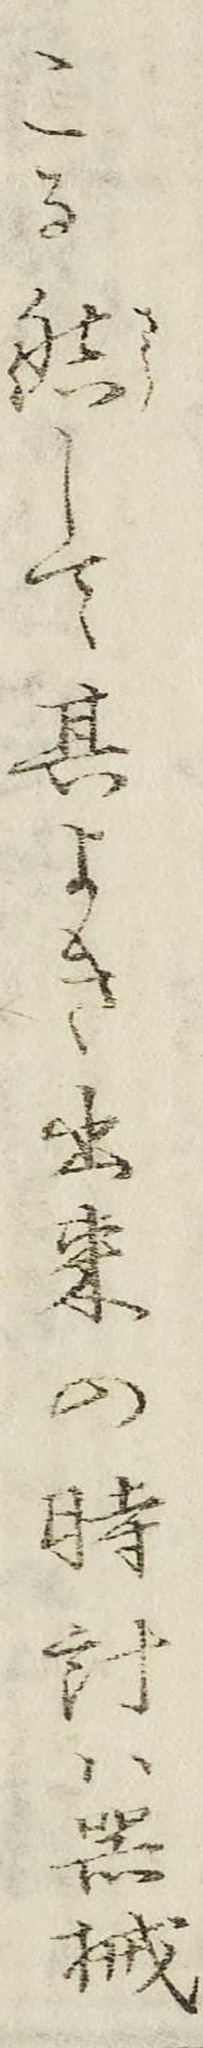こる然して其よき出来の時計は器械
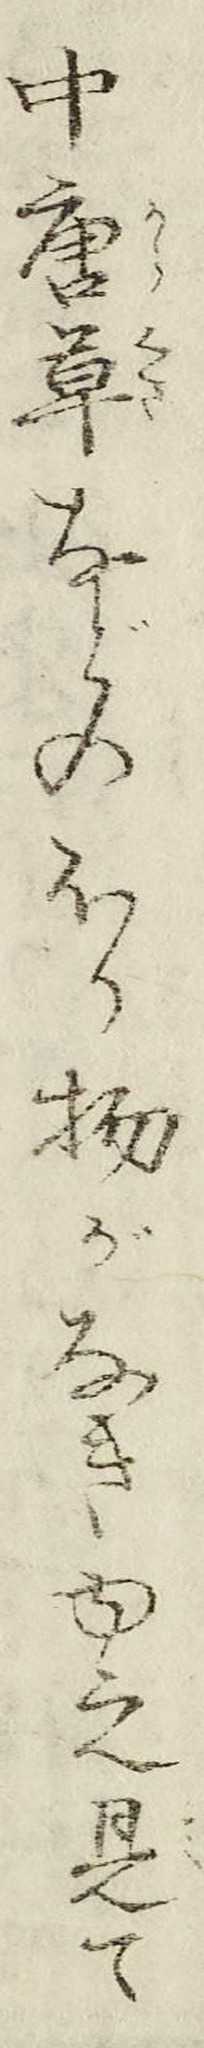中唐草などのほり物がなきゆえ見て
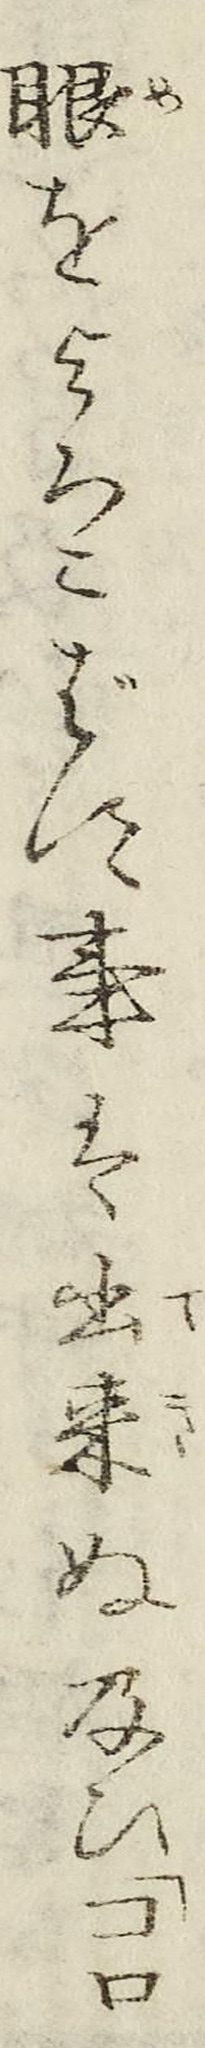眼をよろこばす事は出来ぬ及ひ「コロ
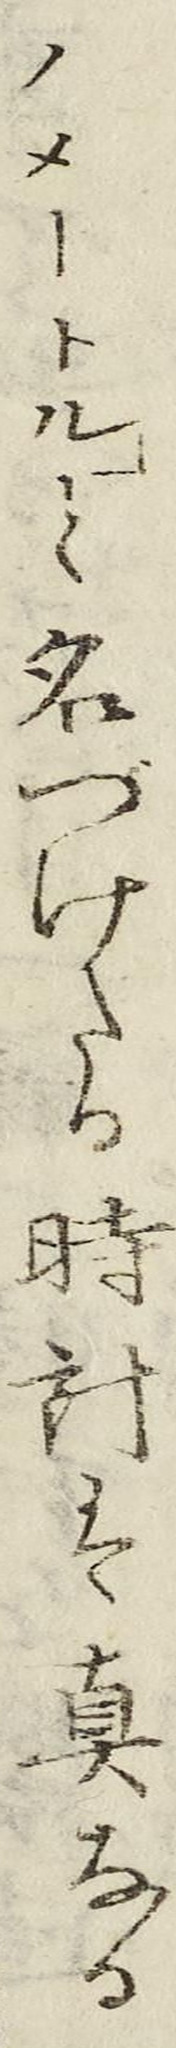ノメートル」と名づけたる時計は真なる
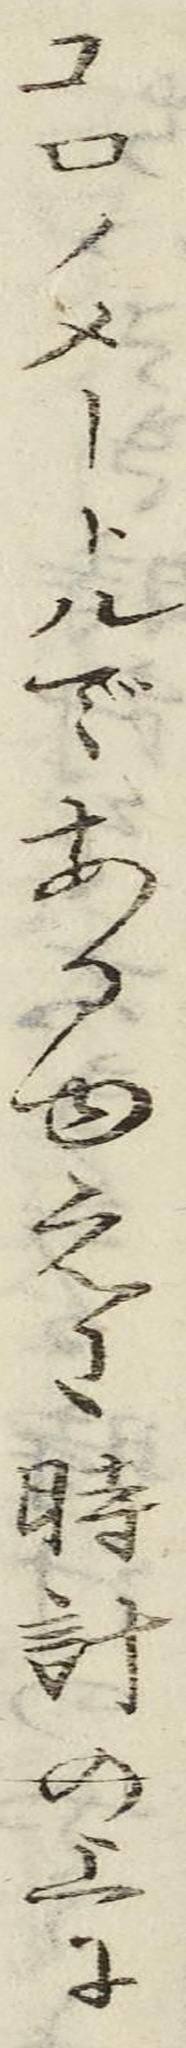コロノメートルであるゆえに時計の上に
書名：[時計に関する冊子]
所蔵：東京大学地震研究所図書室 Earthquake Research Institute Library, The University of Tokyo, JAPAN
